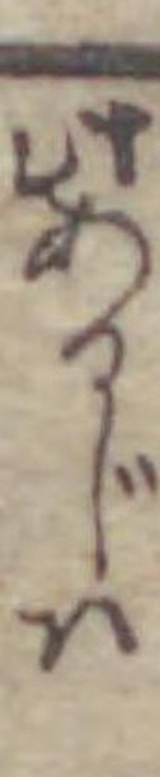此あるじは
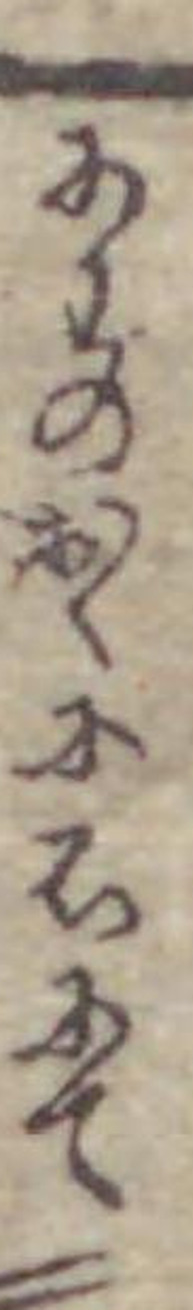にわのおくに石にて
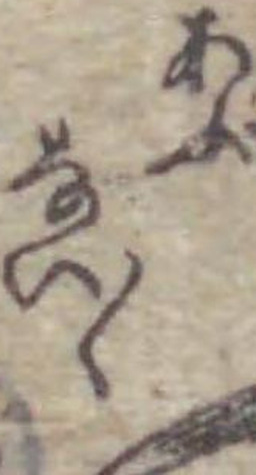ない〳〵
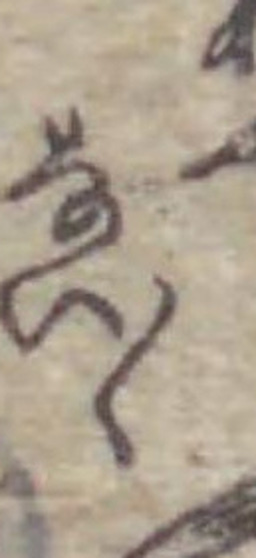ない〳〵
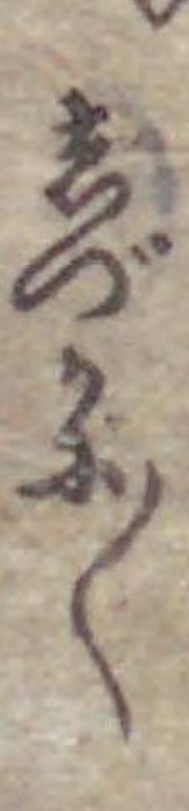しづかに〳〵
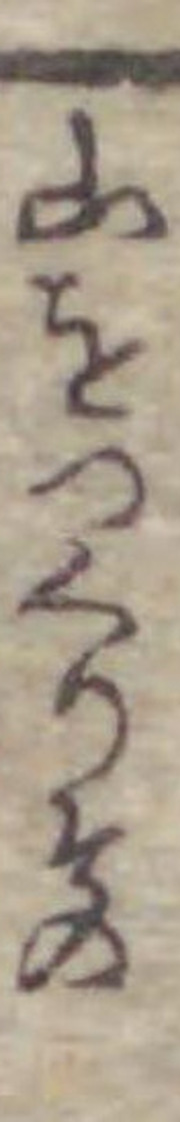山をつくりその
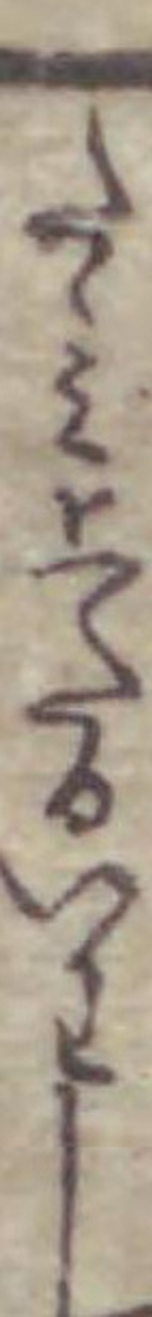たゝみ上たるいわ
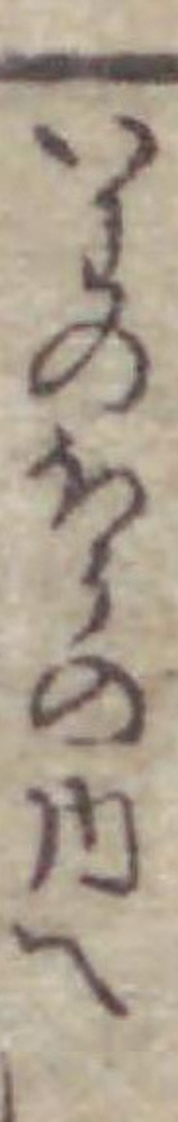いわのほうの門へ
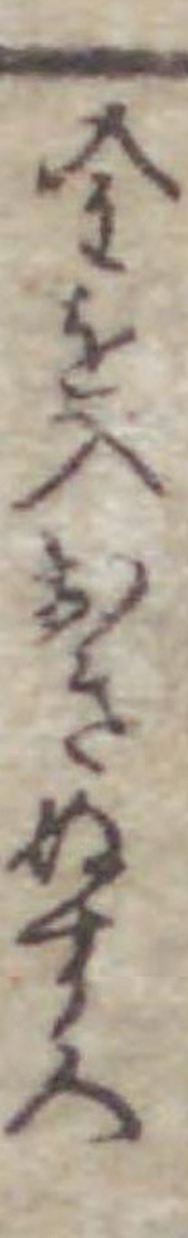金を入おきぬす人
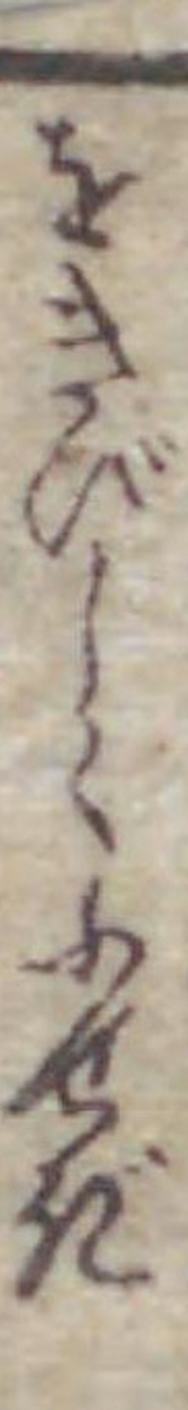をきびしくふせぎ
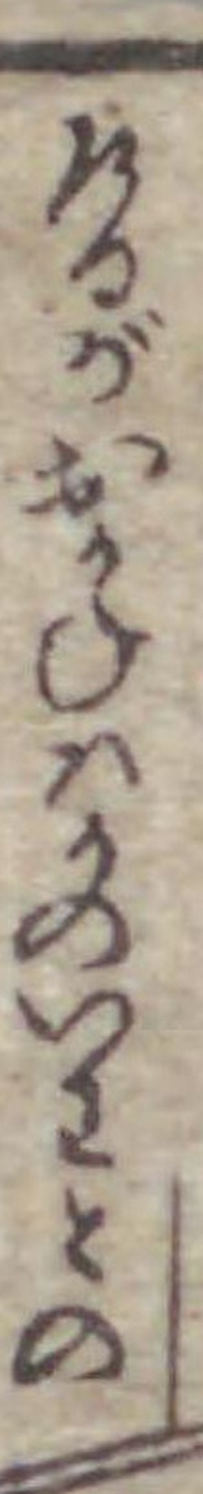けるがおかねはかのいわとの
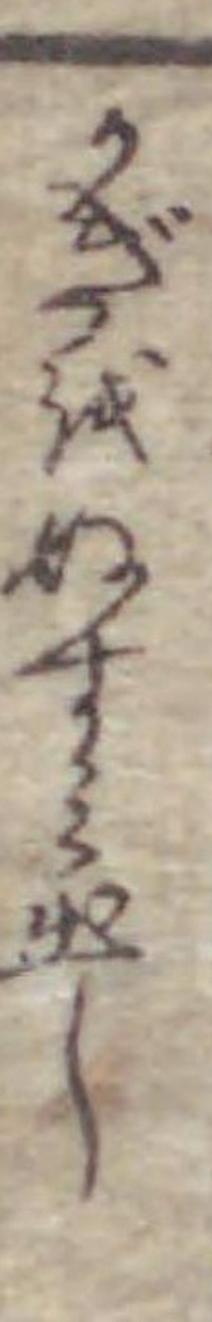かぎをぬすみ出し
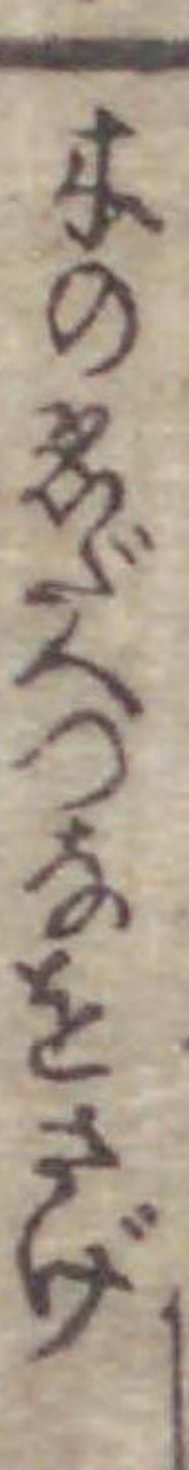木のゑだへつなをさげ
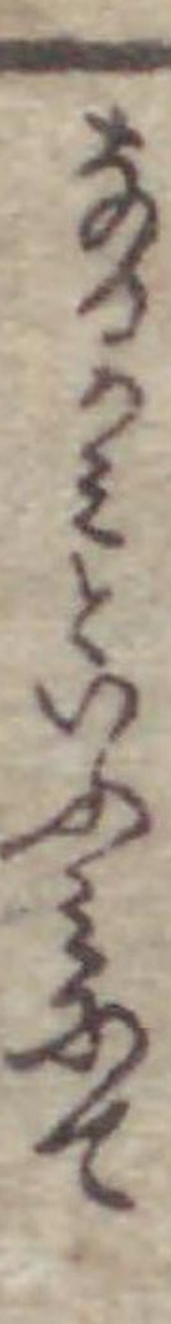なるかみといふみにて
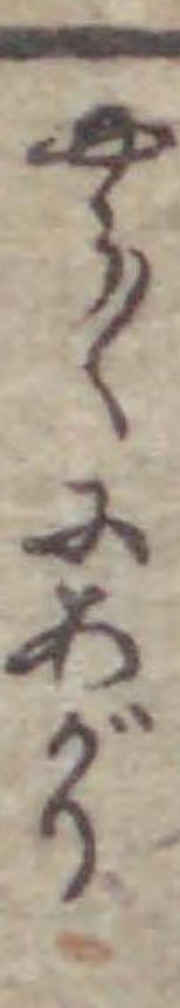やう〳〵にあがり
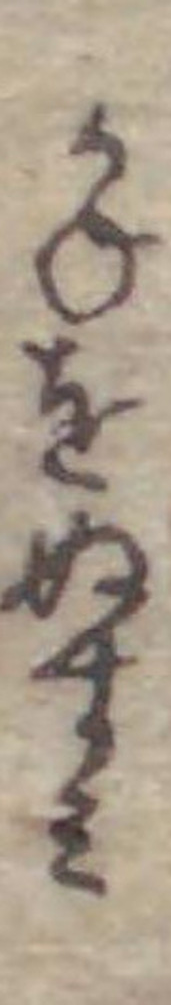かねをぬすみ
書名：嗚呼不侭世之助噺 : 3巻
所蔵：国立国会図書館 National Diet Library, JAPAN
